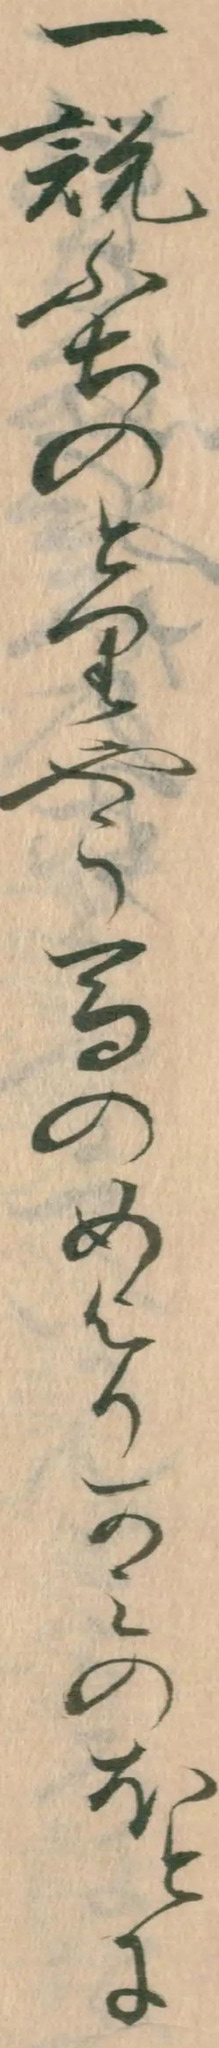一説ふちのとりやう馬のめよりかみのほとに
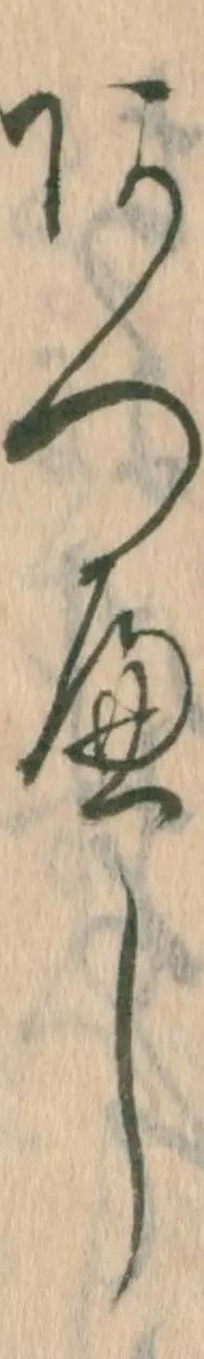あつへし
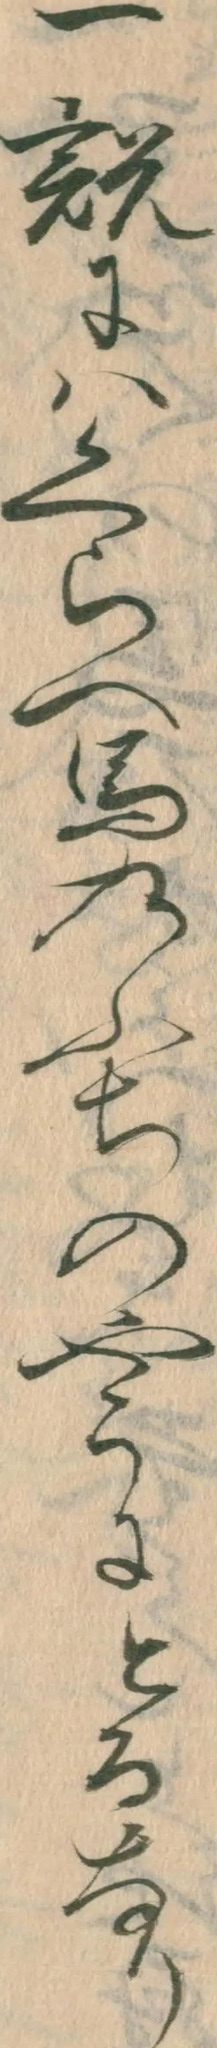一説にはくらへ馬のふちのやうにとるなり
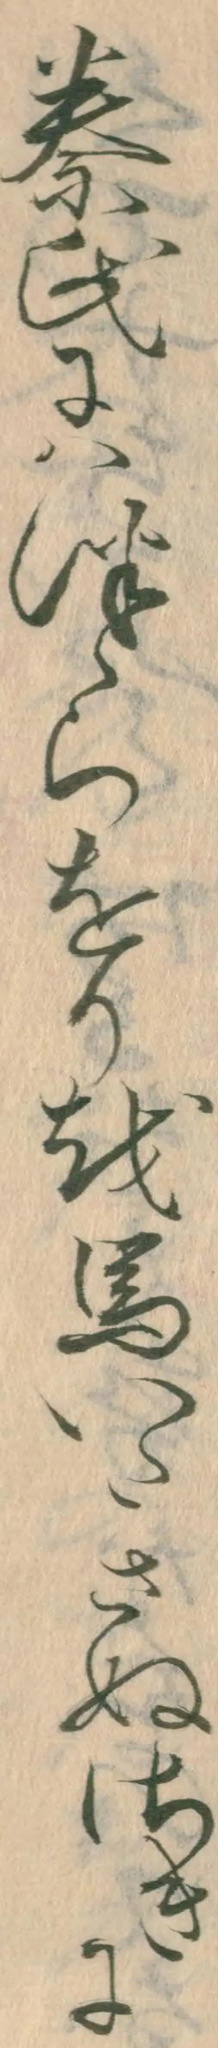秦氏にはつゝらをりを馬いたさぬさきに
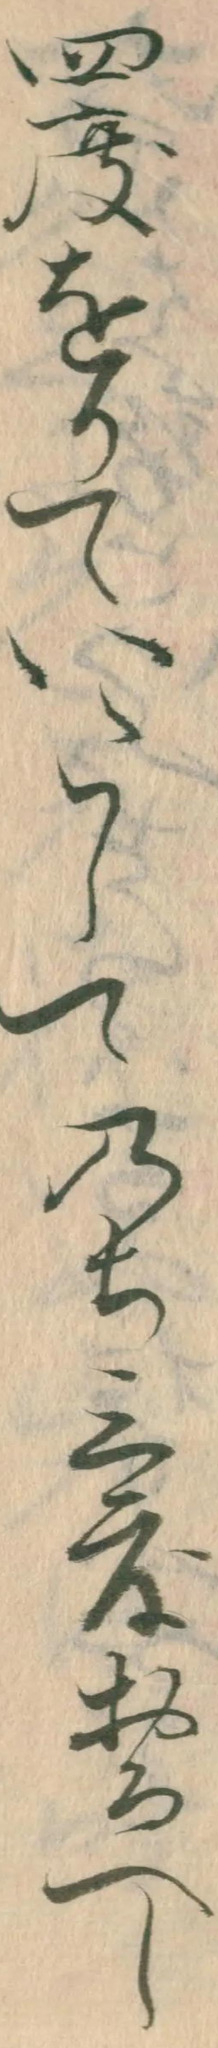四度をりていたしてのち三度おるへし
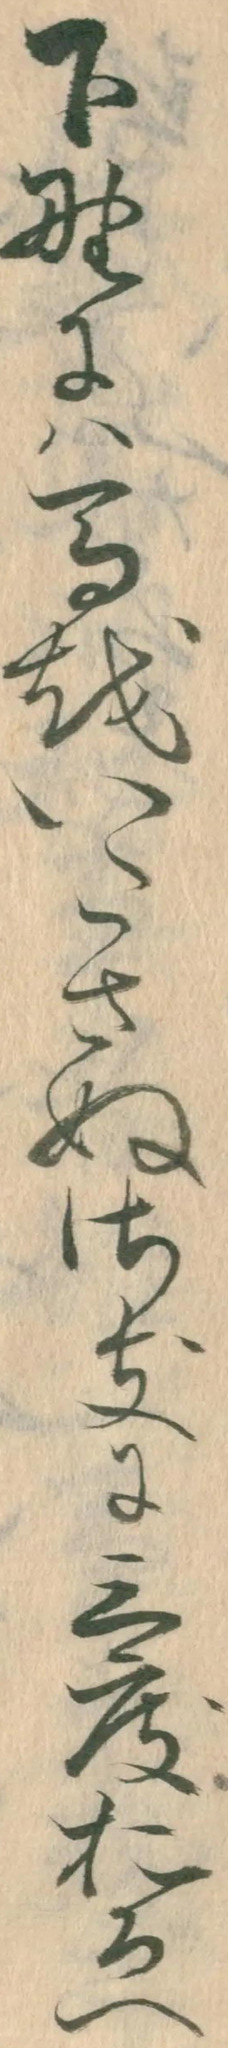下野には馬をいたさぬさきに三度おるへ
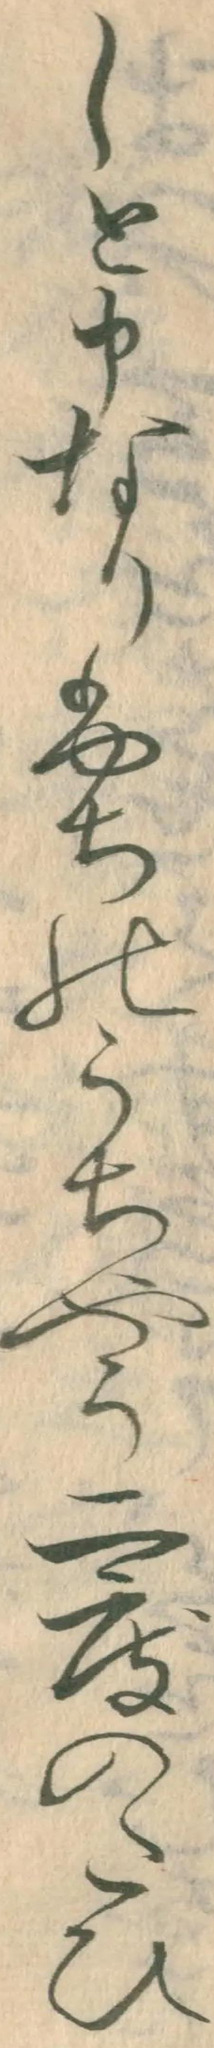しと申なりふちのうちやう二度のたひ
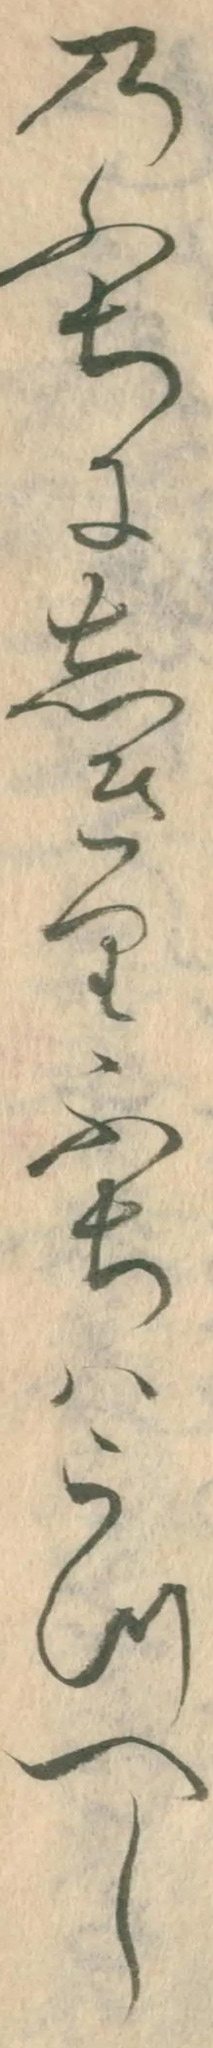のふちにしきりふちはうつへし
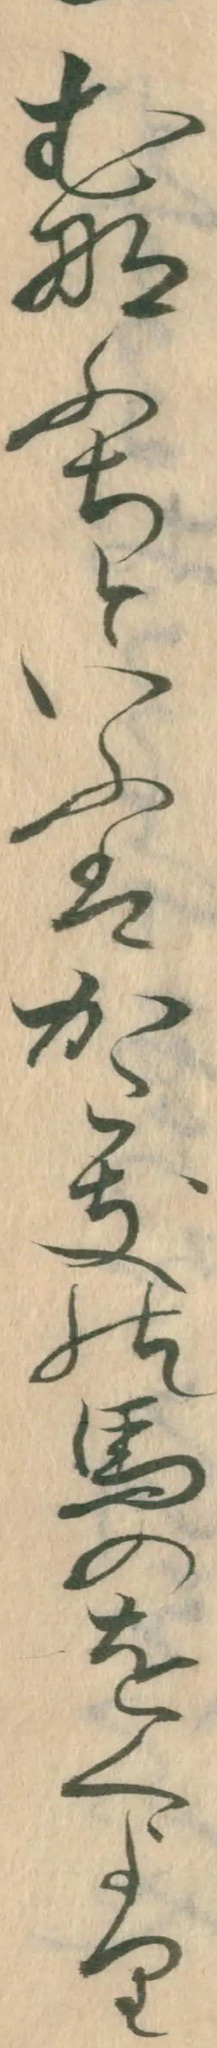一むなふちといふはかたきの馬のをくより

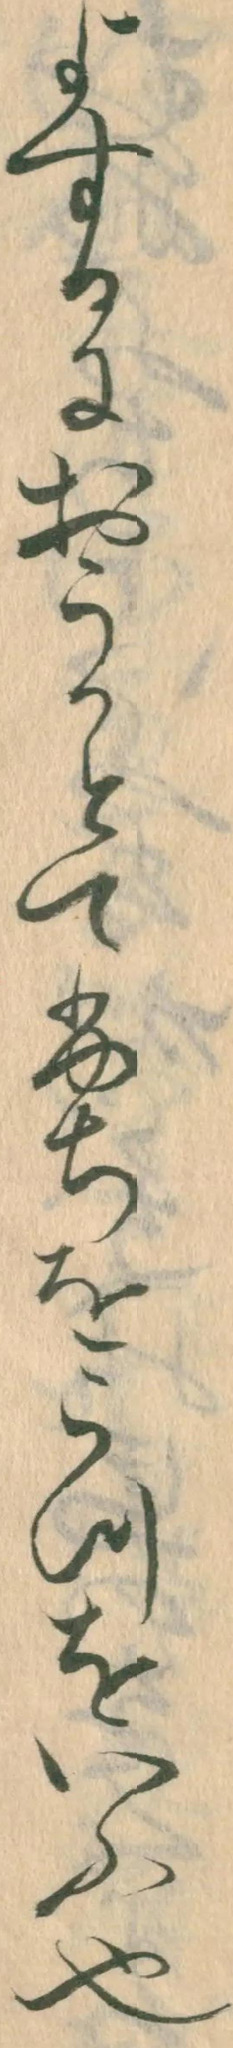よするにおうかとてふちをうつをいふ也
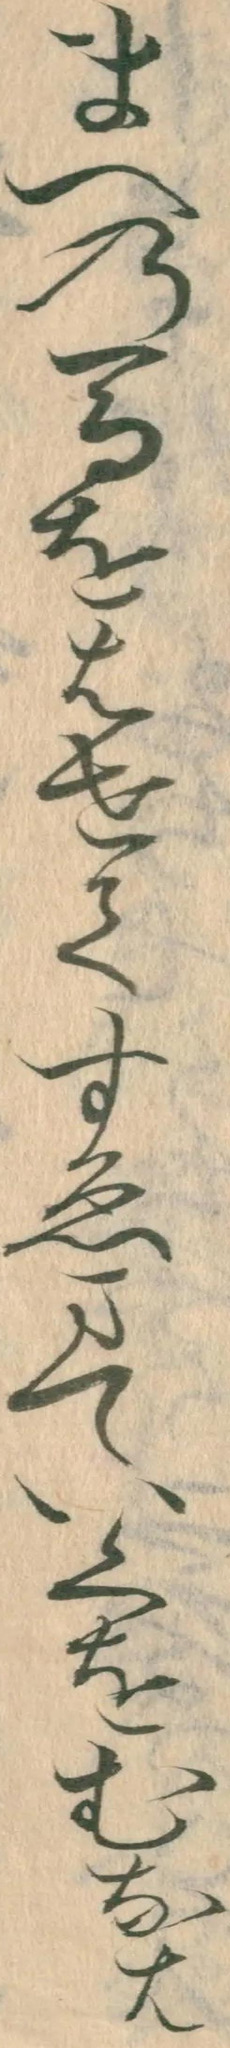まへの馬をはせてすゑまていくをむなは
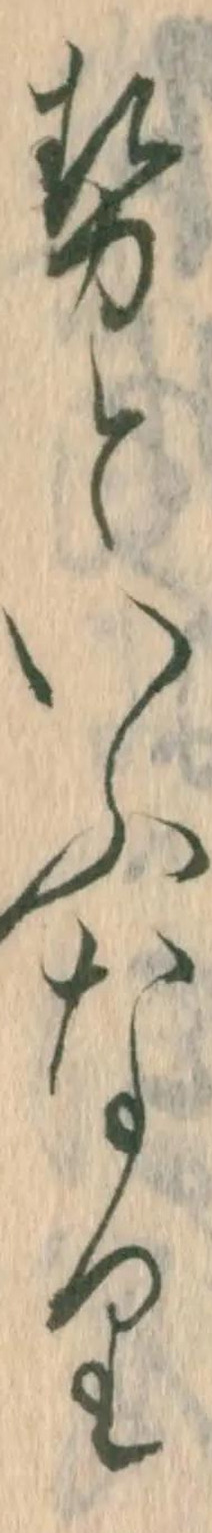せといふなり
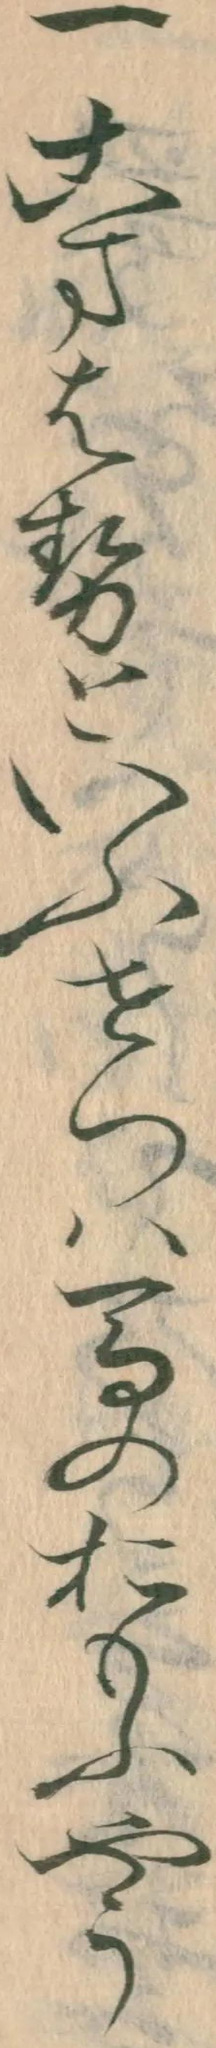一こまはせといふせつは馬のおもふやう
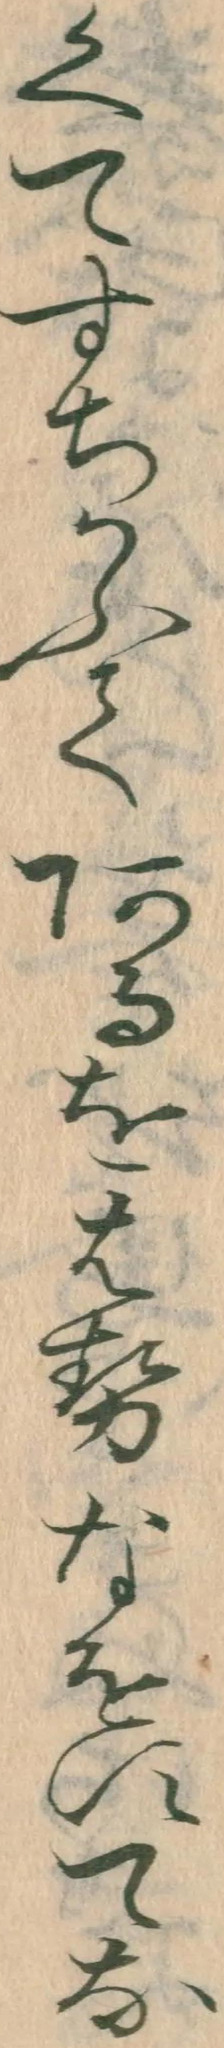くてすちかふてあるをはせなをすてな
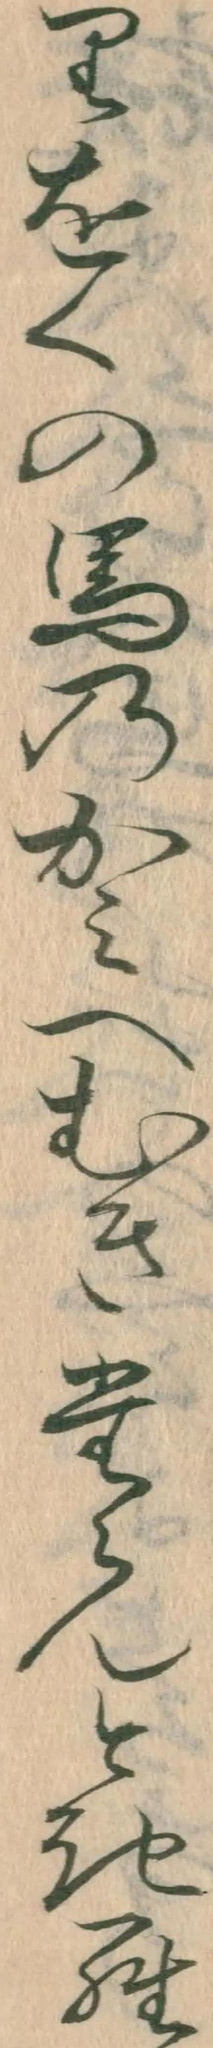りをくの馬のかみへむきたらんときら
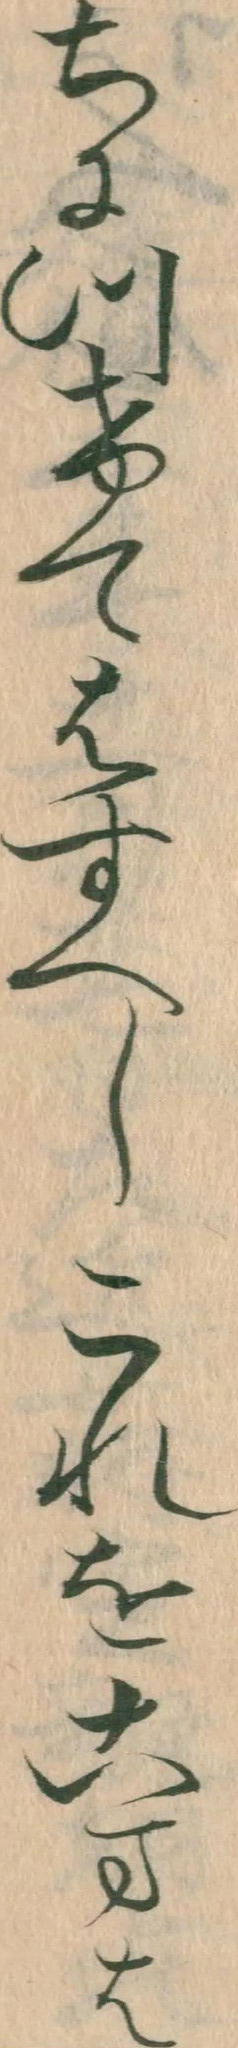ちにつけてはすへしこれをこまは
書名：賀茂社記録. 第13冊
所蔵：国立国会図書館 National Diet Library, JAPAN
